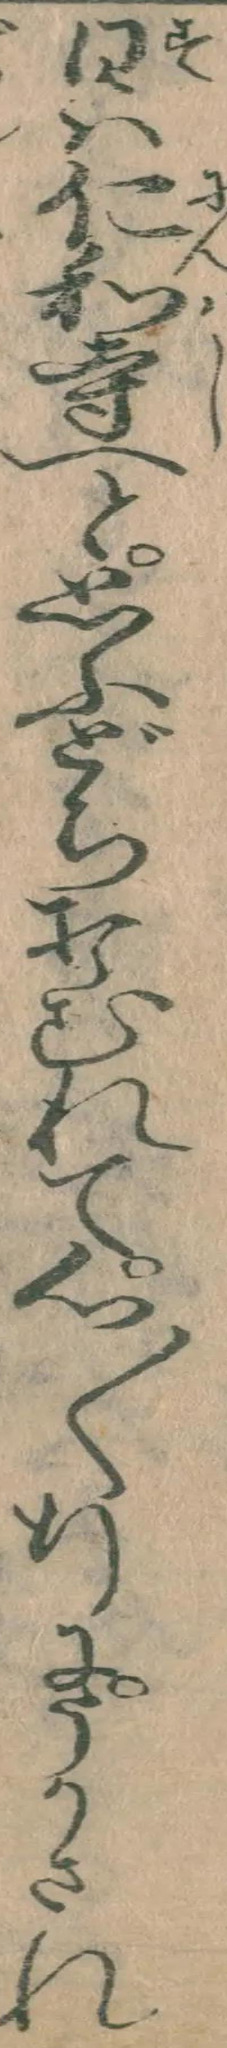日は仁和寺へと。思ふどち打むれて。心々行に。うかされ
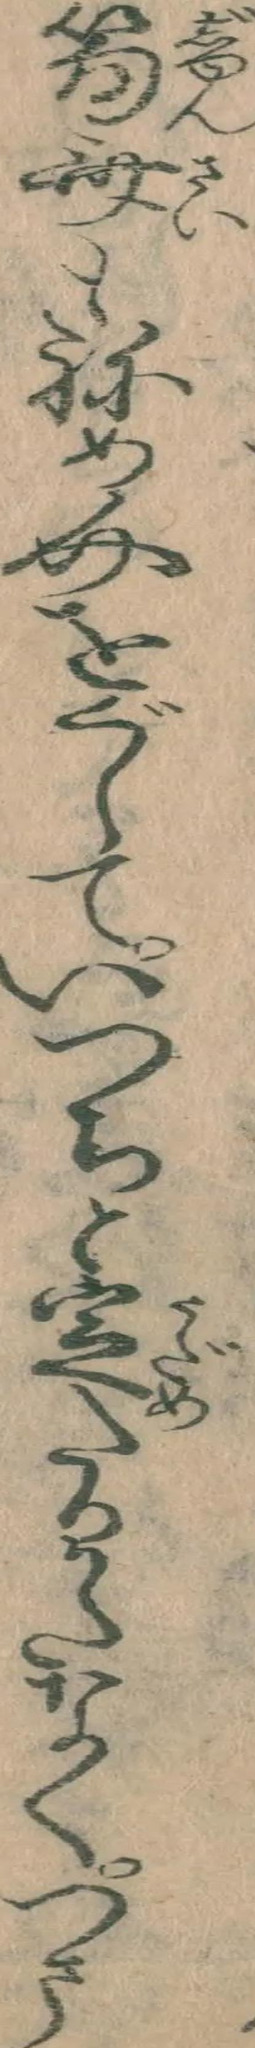筍斎もねめ介をぐして。いつちと定たるかたなく。つ
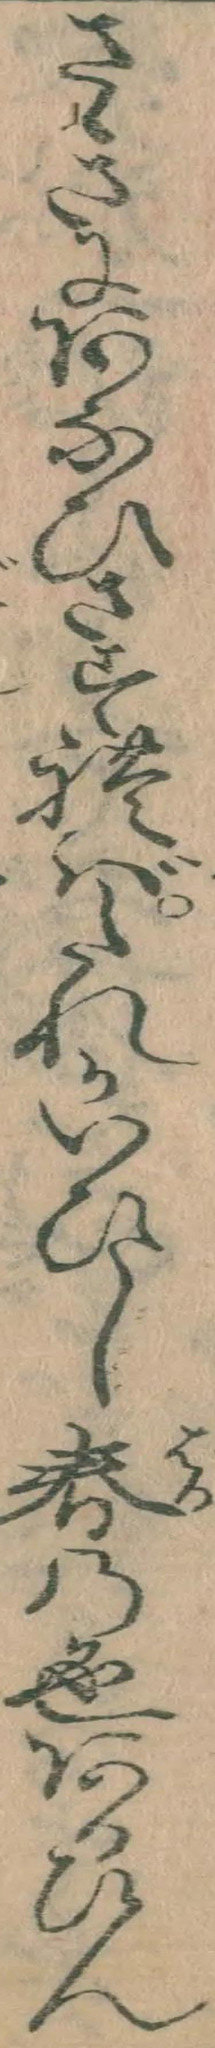さゝきにあなひさすれば。たれかいひし春の色あるひん
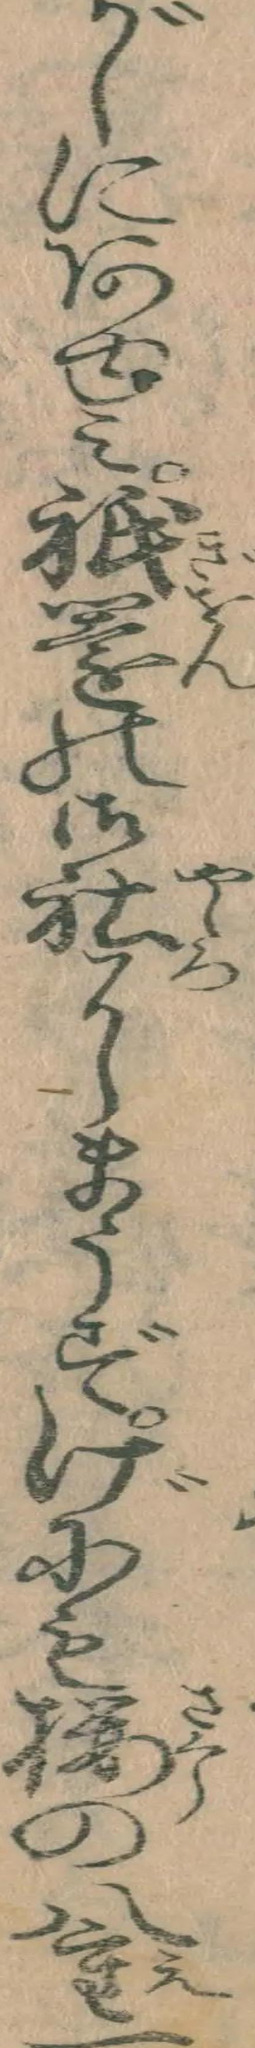がしにあゆみ。祇園の御社にまうず。げにも桜の八重一
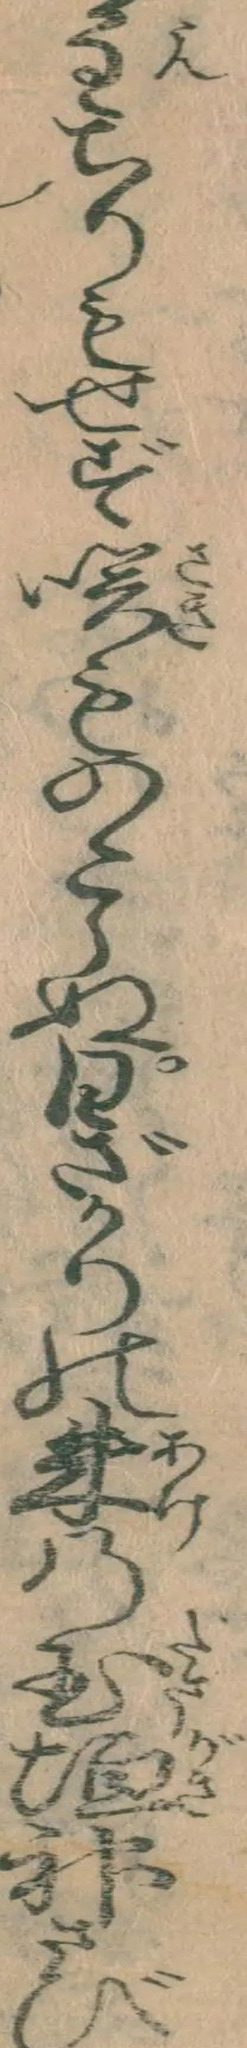重ちりもせず咲ものこらぬ。日ざかりの朱の玉垣神さび
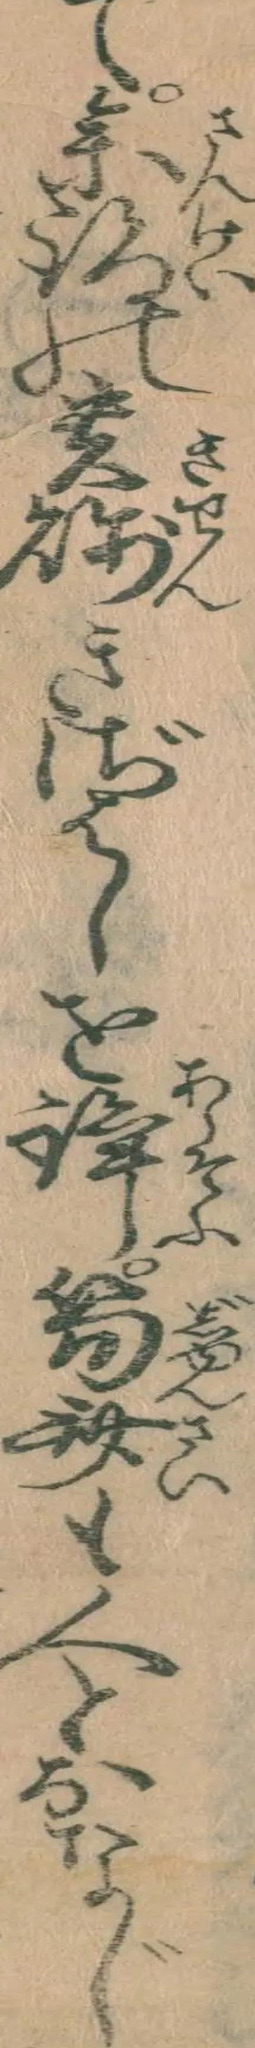て。参詣の貴賎きざはしを諍。筍斎も人とおなじ
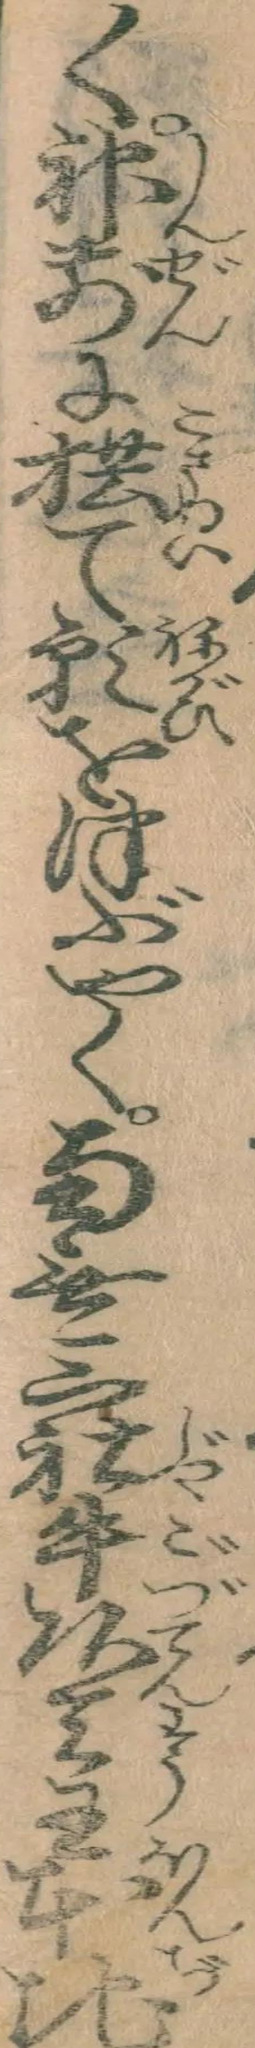〱。神前に拱て願をつぶやく。南無三社牛頭天王本地
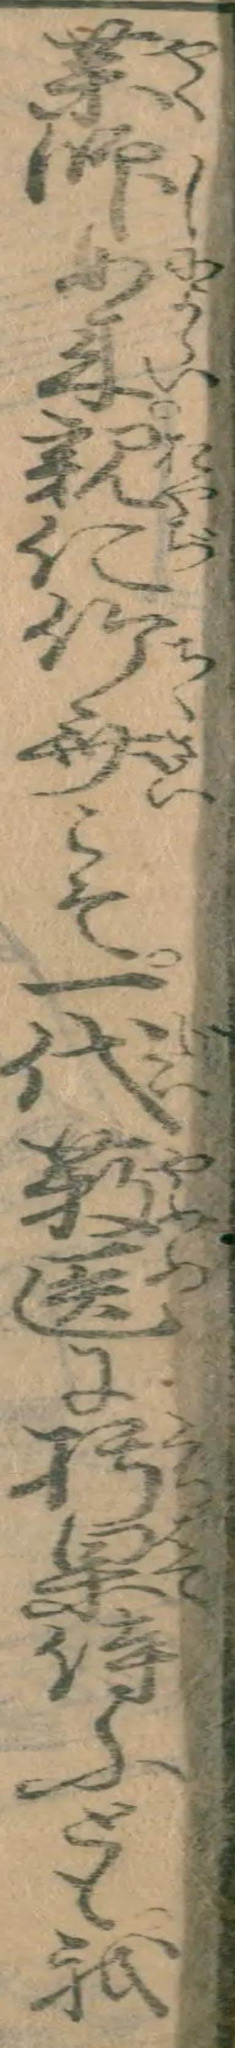薬師如来。親仁竹斎こそ。一代薮医に朽果侍ふとも我
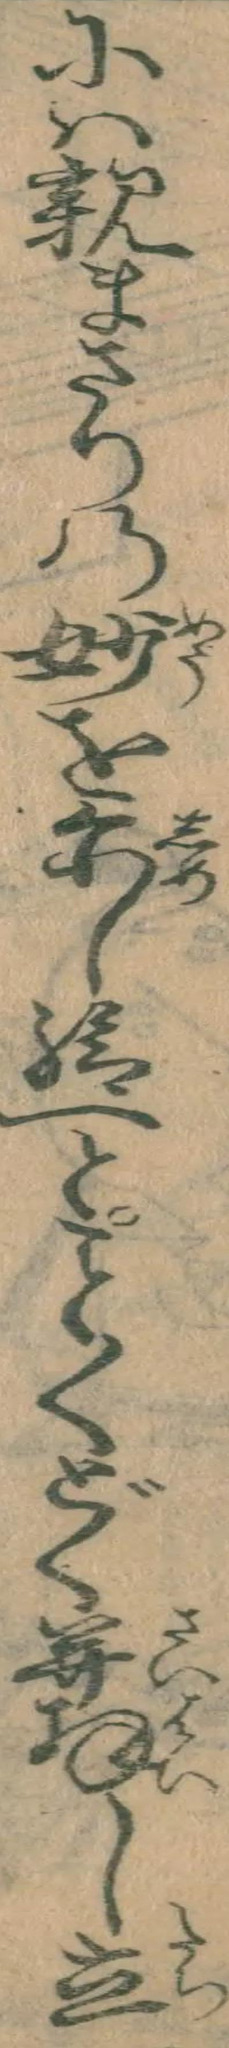には親まさりの妙を示し給へと。ことくどく再拝し立
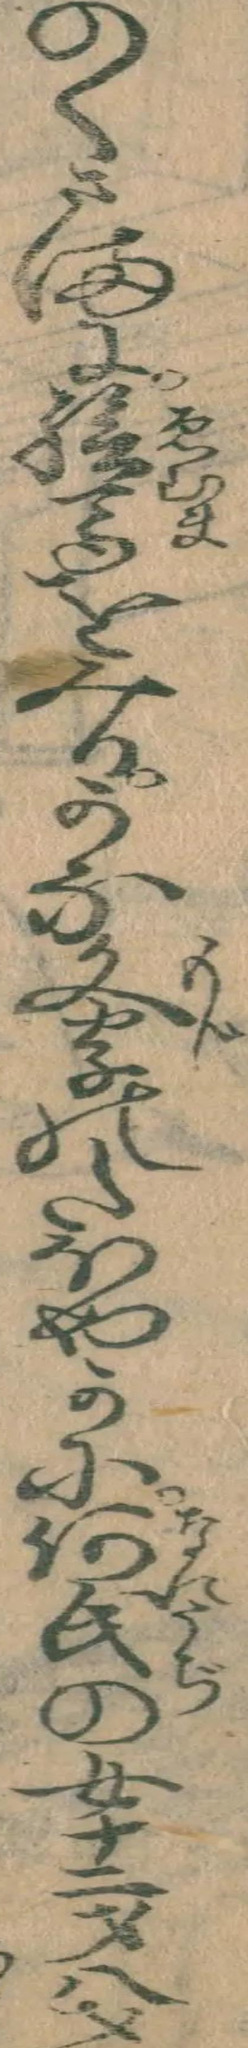のくさまに。給馬をみる。かな文字のたほやかに。何氏の女十二才八才
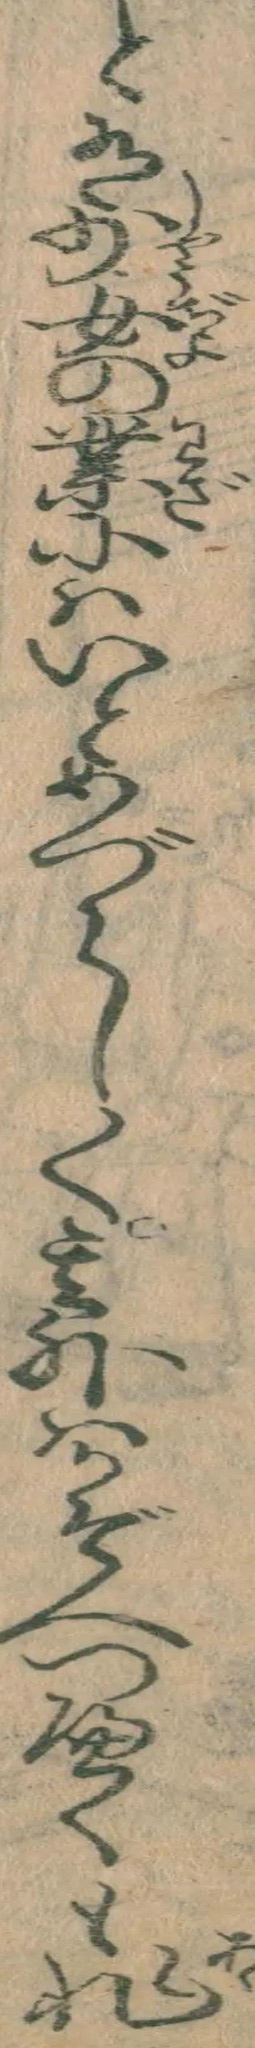と有少女の業にはいとめづらしく。其外はかぞへつへくも非
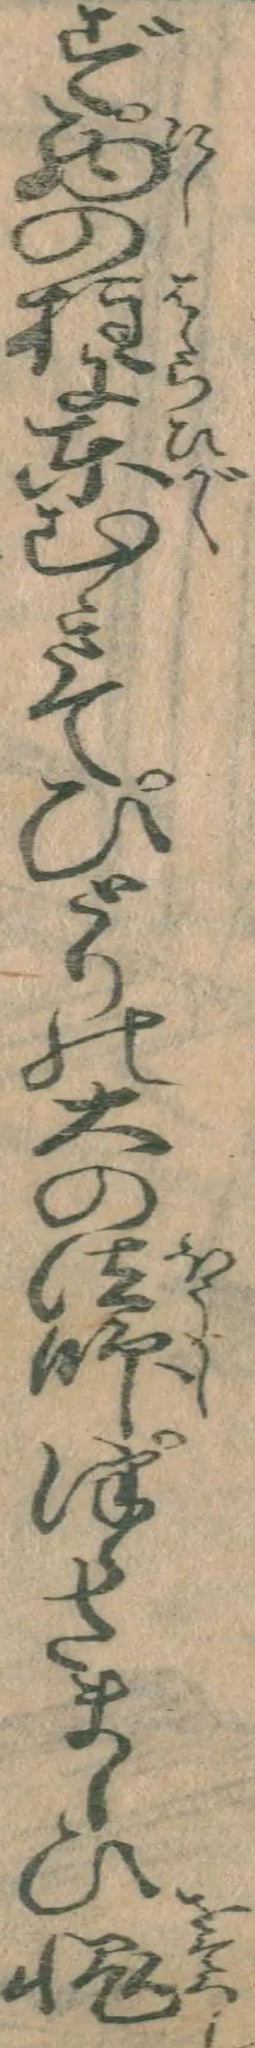ず。西の柱に東むきて。ひとりの大の法師。つらたましひ恐
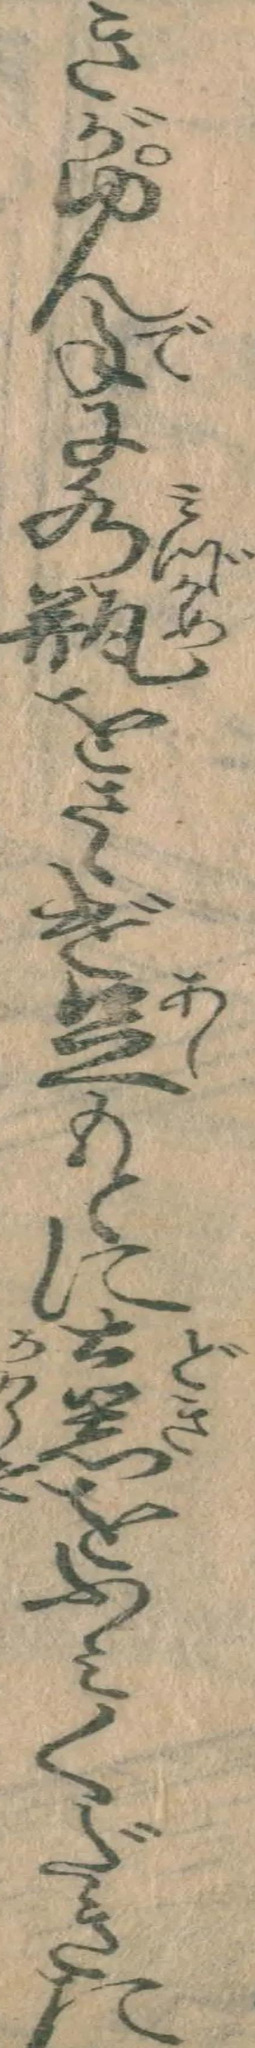きが。ゆん手に水瓶をさゝげ足もとに土器をふみくだきた
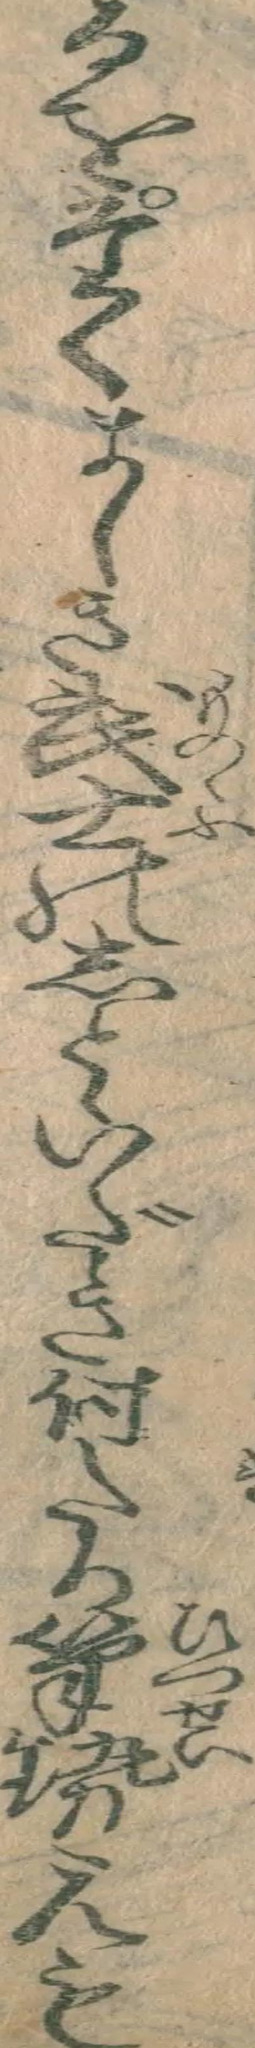るを。たくましき武士のしとゝいだき付たり筆勢えも
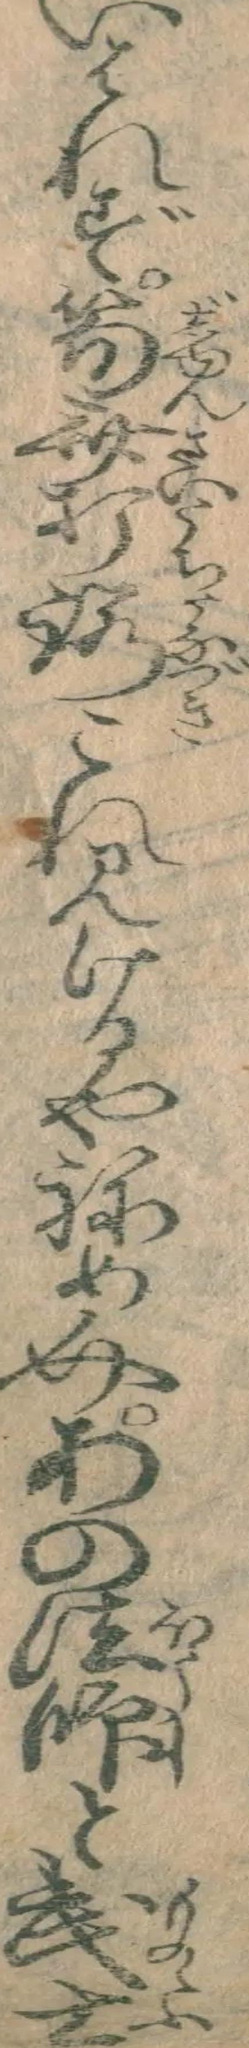いはれず。筍斎打諾これみけるやねめ介。あの法師と武士
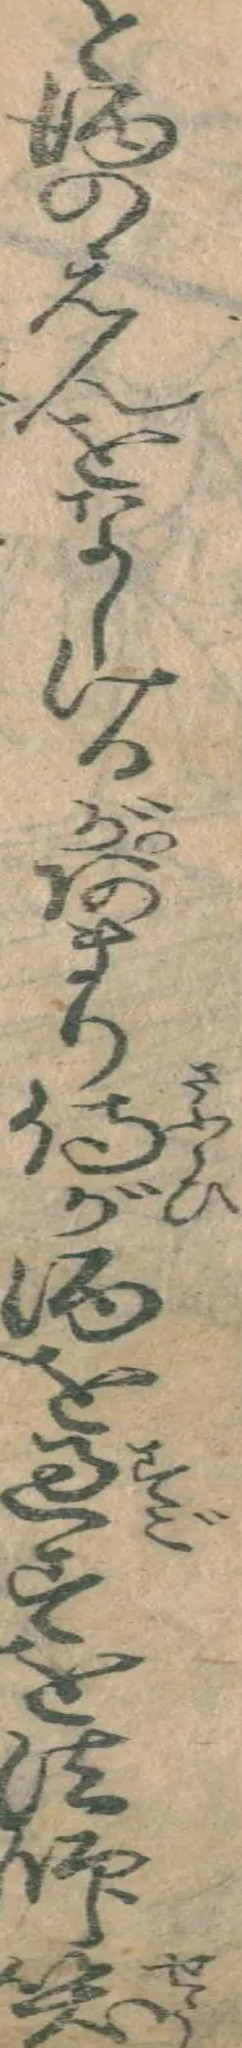と酒のえんをなしけるが。あまり侍が酒を過すを法師笑
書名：新竹斎 5巻
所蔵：国立国会図書館 National Diet Library, JAPAN
